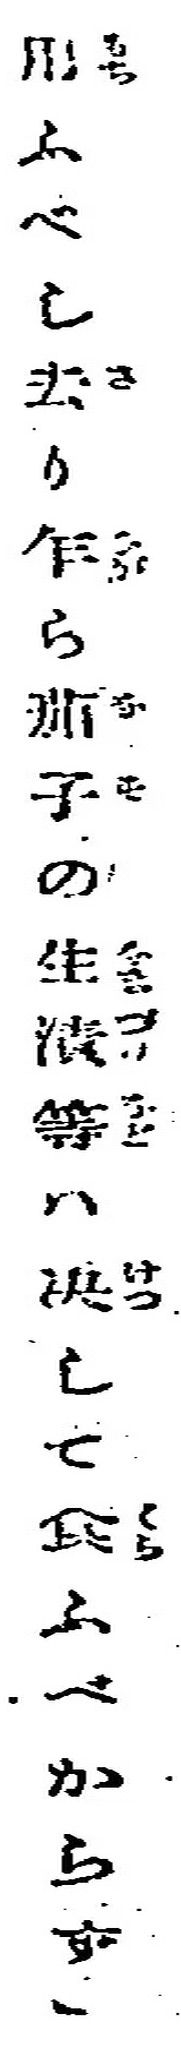用ふべし去り乍ら茄子の生漬等は決して食ふべからず
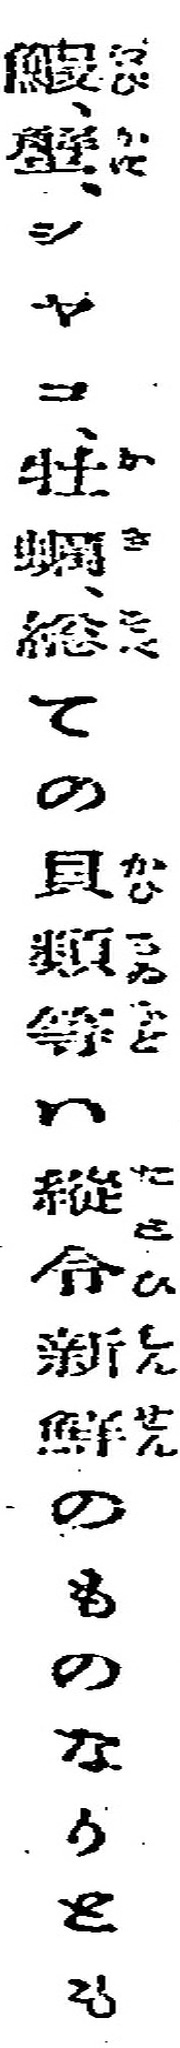鰕、蟹、シヤコ、牡蠣総ての貝類等は縦令新鮮のものなりとも
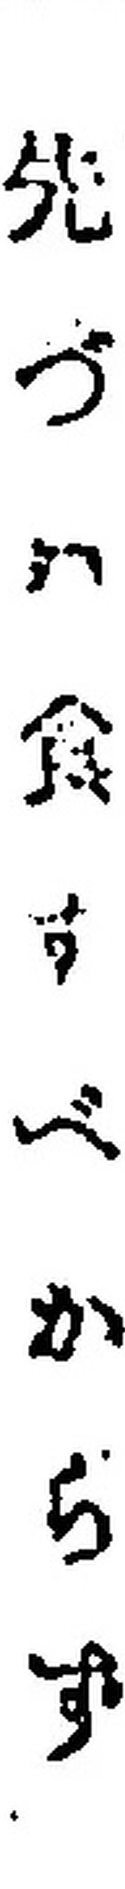先づは食すべからず
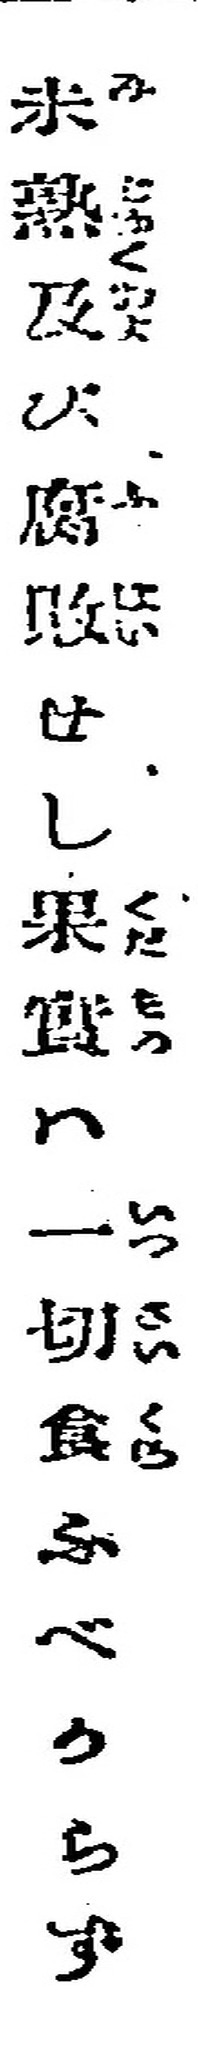未熟及び腐敗せし果實は一切食ふべからず
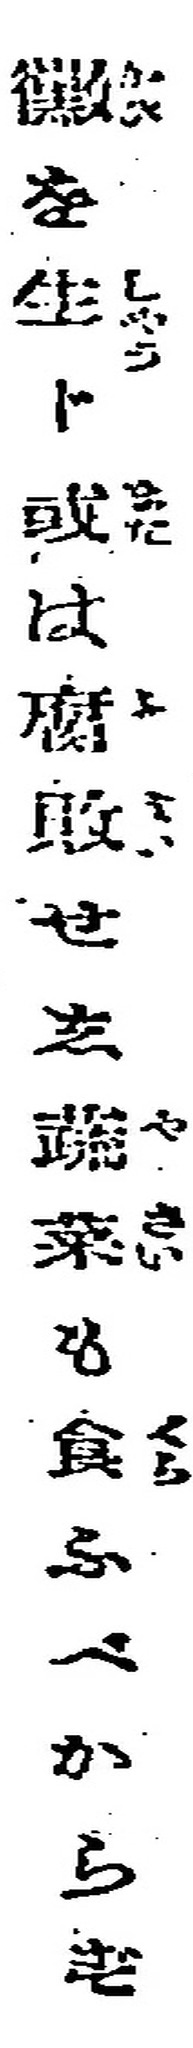黴を生じ或は腐敗せし蔬菜っも食ふべからず
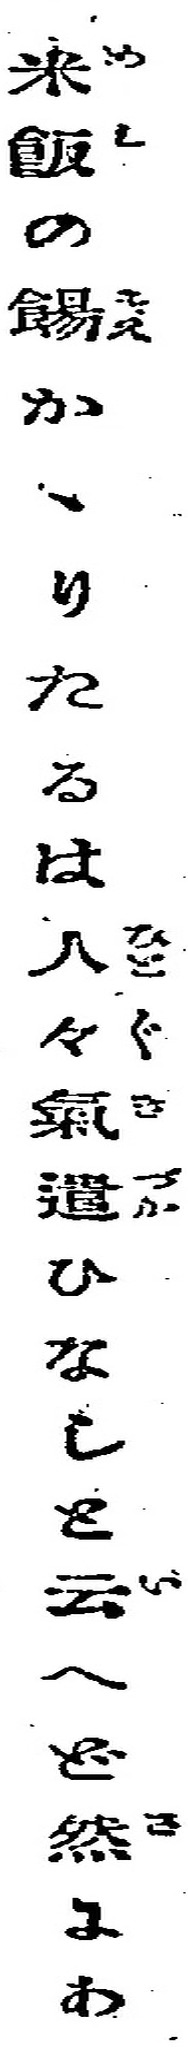米飯の餳ゝりたるは人々気遣ひなしと云へど然にあ
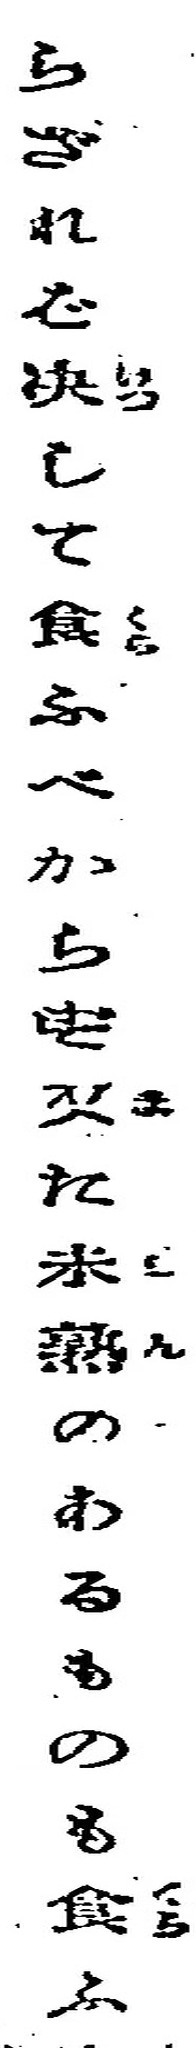らざれば決して食ふべからず又た未熟のあるものも食ふ
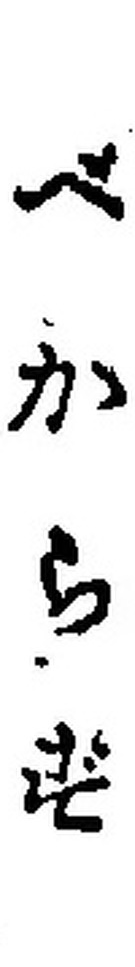べからず
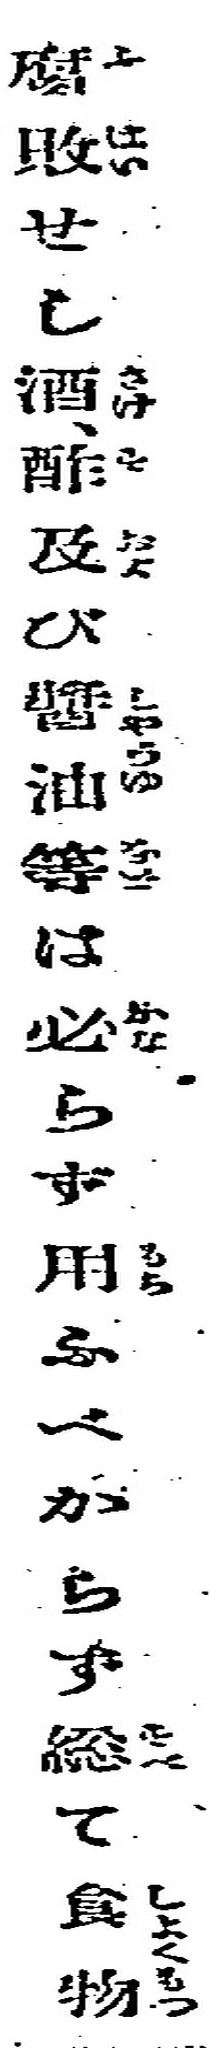腐敗せし酒、酢及び醤油等は必らず用ふべからず総て食物
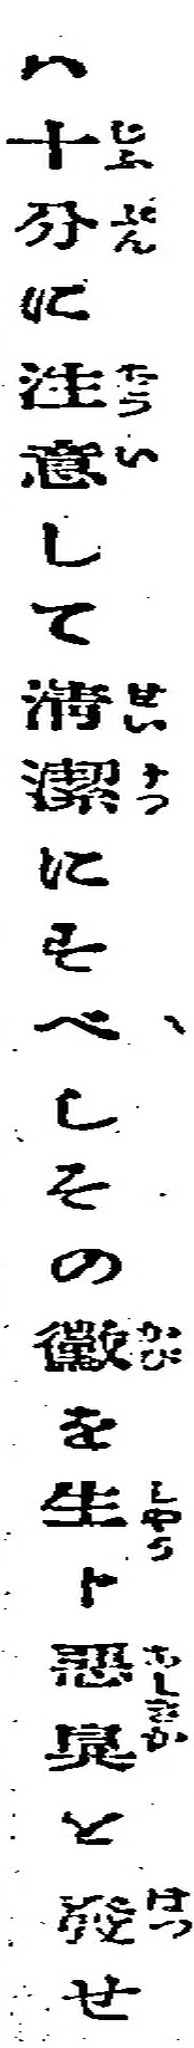は十分に注意して清潔にすべしその黴を生じ悪臭を發せ
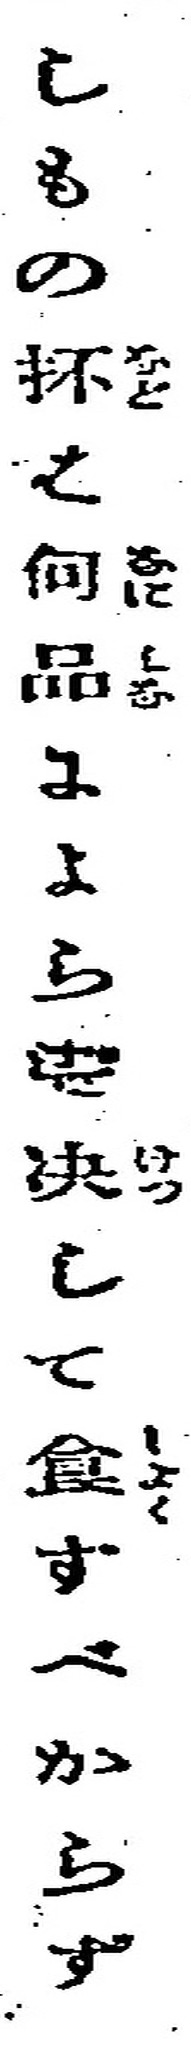しもの抔は何品によらず決して食すべからず
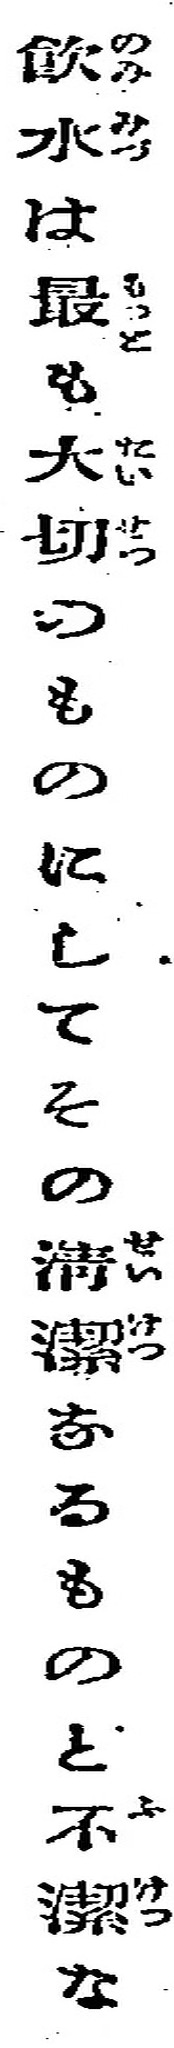飲水は最も大切のものにしてその清潔なるものと不潔な
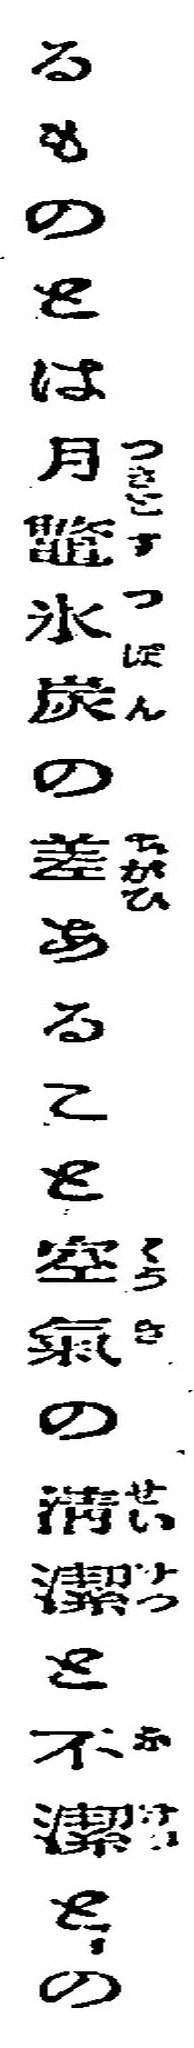るものとは月鼈氷炭の差あること空気の清潔と不潔との
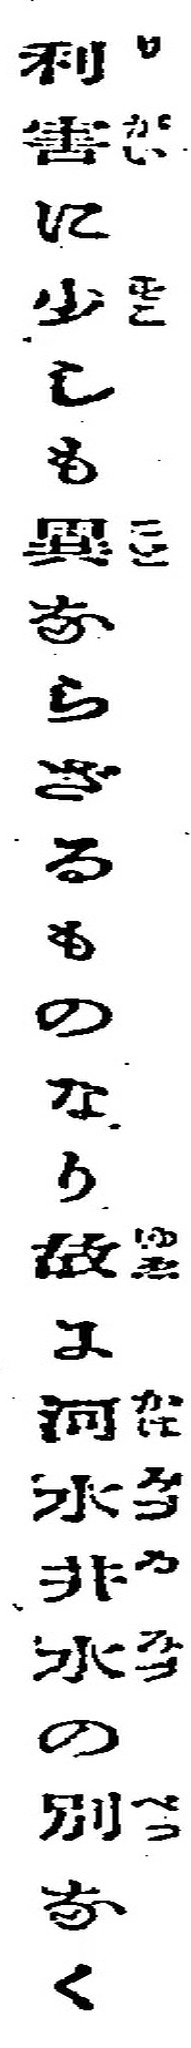利害に少しも異ならざるものなり故に河水井水の別なく
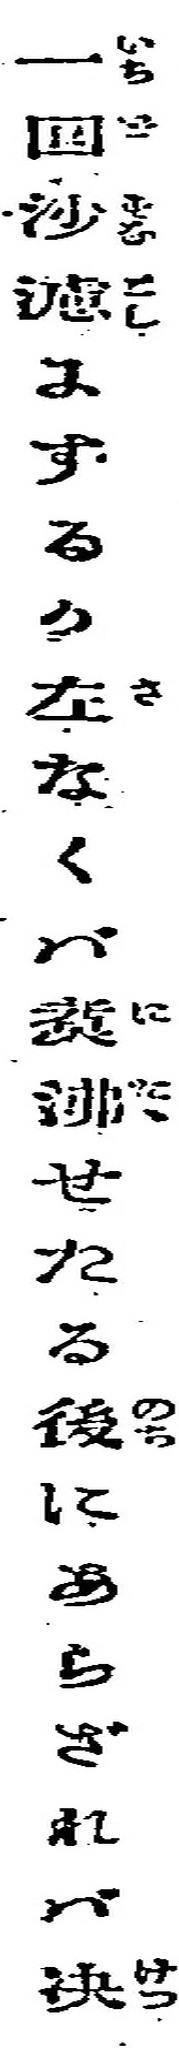一回沙濾にするか左なくば煮沸せたる後にあらざれば決
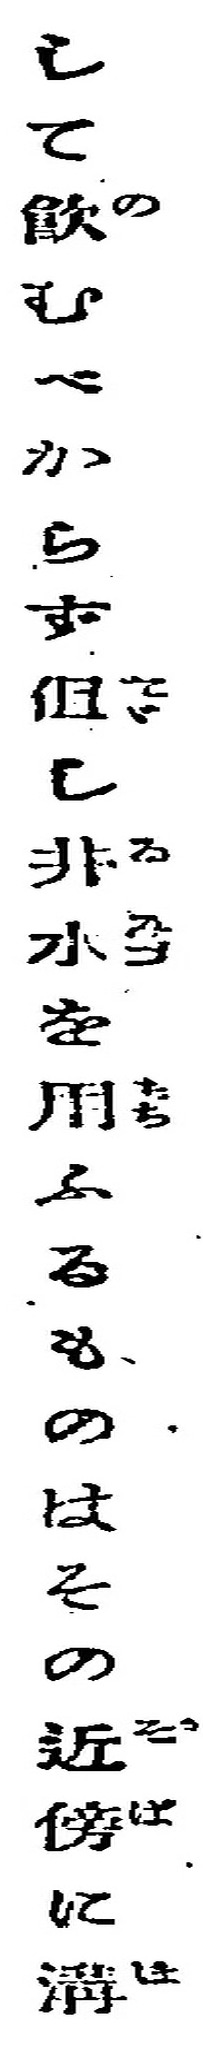して飲むべからず但し井水を用ふるものはその近傍に溝
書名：新撰暑中養生法 : 附・コレラ予防歌
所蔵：国立国会図書館 National Diet Library, JAPAN
